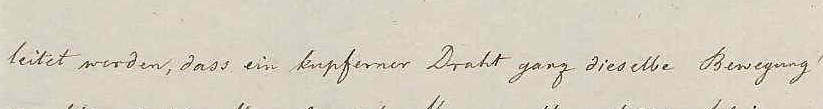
leitet werden, dass ein kupferner Draht ganz dieselbe Bewegung
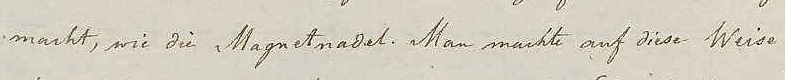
macht, wie die Magnetnadel. Man machte auf diese Weise
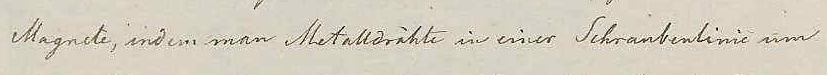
Magnete, indem man Metalldrähte in einer Schraubenlinie um
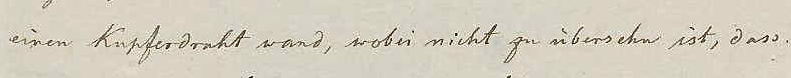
einen Kupferdraht wand, wobei nicht zu übersehn ist, dass
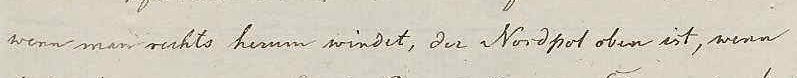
wenn man rechts herum windet, der Nordpol oben ist, wenn
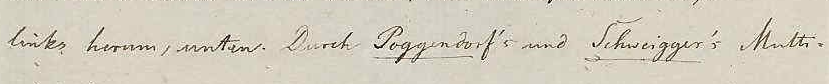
links herum, unten. Durch Poggendorf's und Schweigger's Multi-
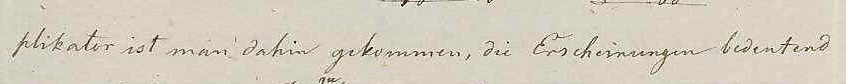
plikator ist man dahin gekommen, die Erscheinungen bedeutend
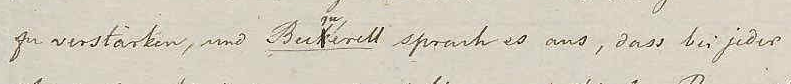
zu verstärken, und Beckquérell sprach es aus, dass bei jeder
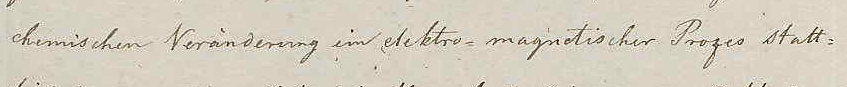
chemischen Veränderung ein elektro-magnetischer Prozes statt-
